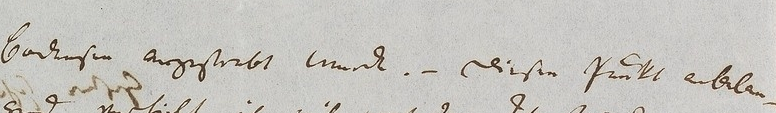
Bodensee angestrebt werde. – Diesen Punkt anbelan-
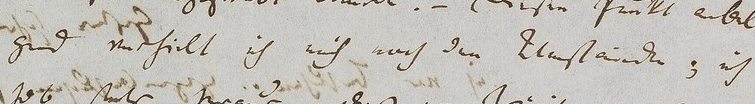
gend verhielt ich mich nach den Umständen; ich
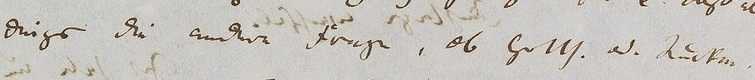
dings die andere Frage, ob Gotth. od. Luckm.
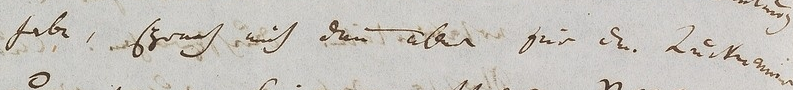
habe, sprach mich dann aber für den Luckmanier
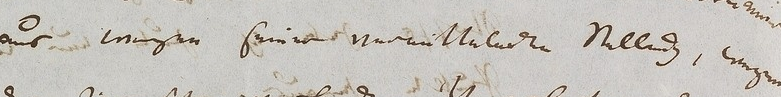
aus wegen seiner vermittelnden Stellung, wegen
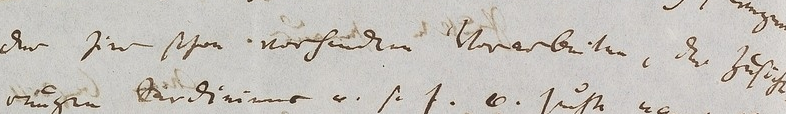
der hier schon vorhandenen Vorarbeiten, der Zusiche-
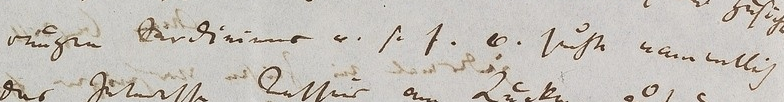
rungen Sardiniens u. s. f. &. suchte namentlich
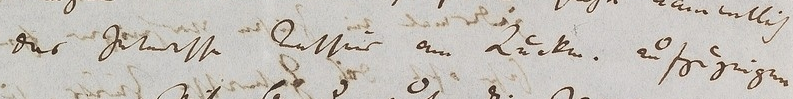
das Interesse Tessins am Luckm. aufzuzeigen.
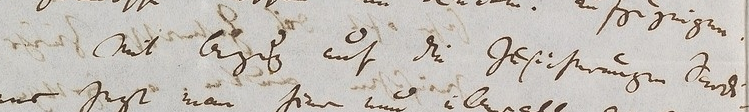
Mit Bezug auf die Zusicherungen Sardi-
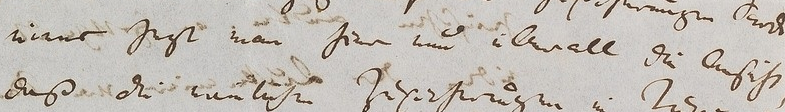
niens hegt man hier nun überall die Ansicht,
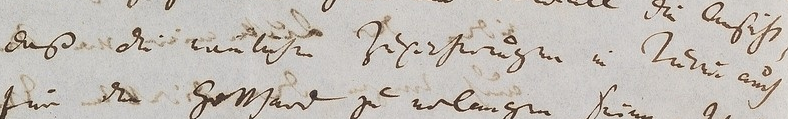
daß die nämlichen Zusicherungen in Turin auch
